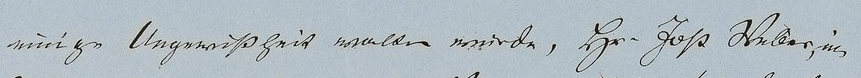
einige Ungewißheit walten würde, Hr. Jost Weber, im
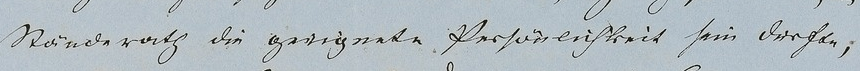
Ständerath die geeignete Persönlichkeit sein dürfte;
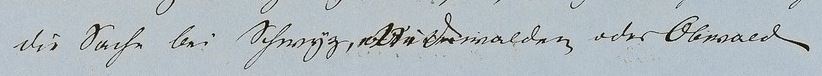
die Sache bei Schwyz, Nidwalden oder Obwalden
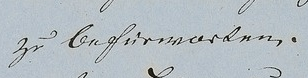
zu befürworten.
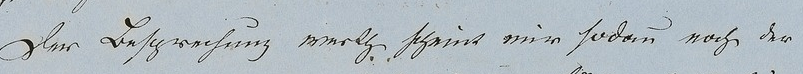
Der Besprechung werth scheint mir sodann noch der
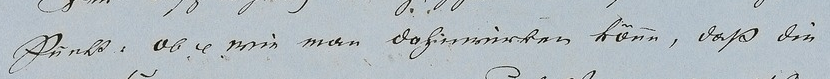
Punkt: ob & wie man dahinwirken könne, daß die
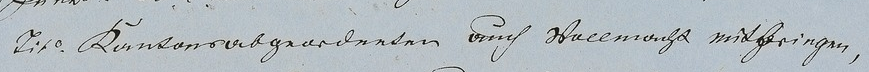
Tito Kantonsabgeordneten auch Vollmacht mitbringen,
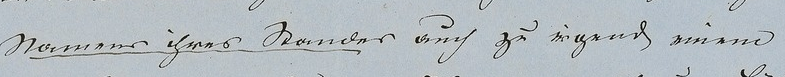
Namens ihres Standes auch zu irgend einem
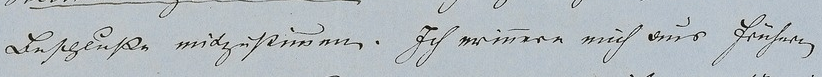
Beschluße mitzustimmen. Ich erinnere mich aus frühern
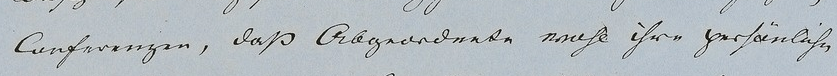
Conferenzen, daß Abgeordnete wohl ihre persönliche
